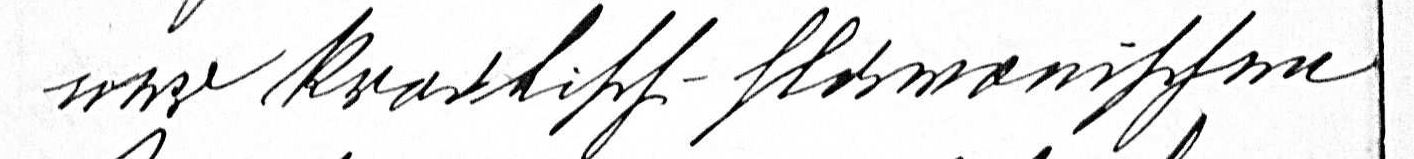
nem kroatisch-slawonischen
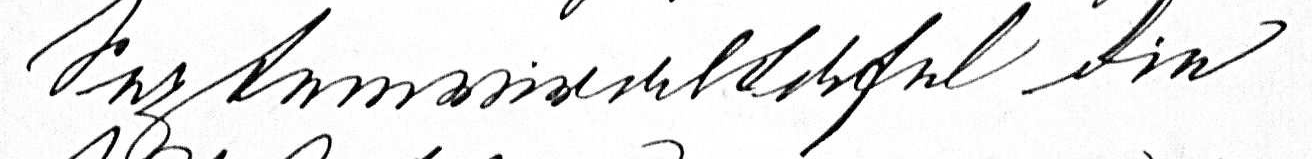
Septemviraltafel die
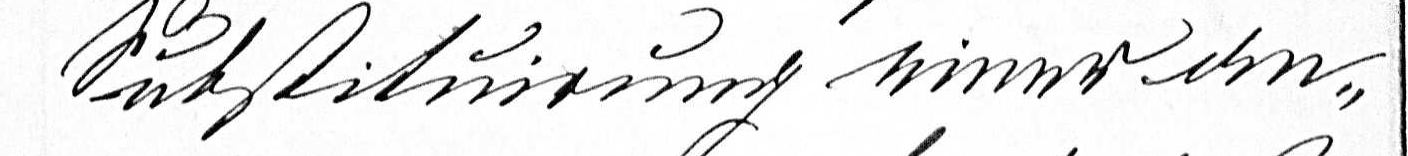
Substituirung einer an¬
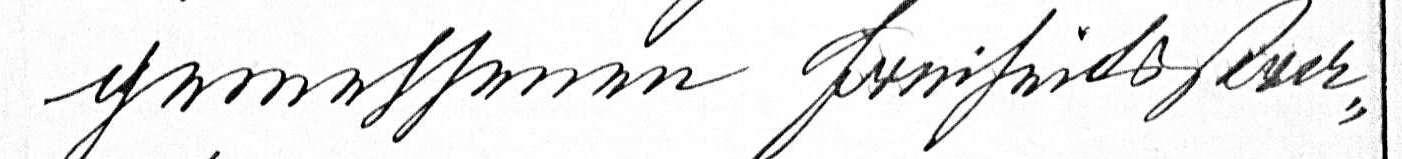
gemessenen Freiheitsstra¬
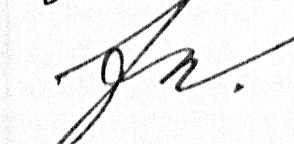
fe.
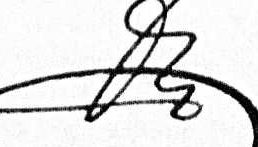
FJ
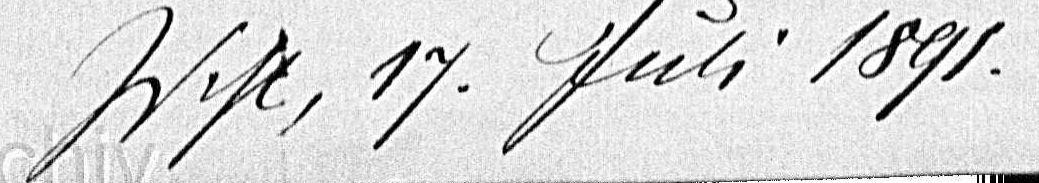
Ischl, 17. Juli 1891
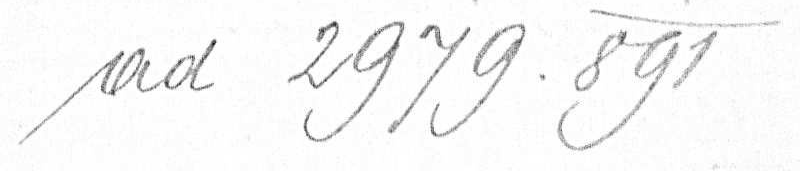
ad 2979 1891
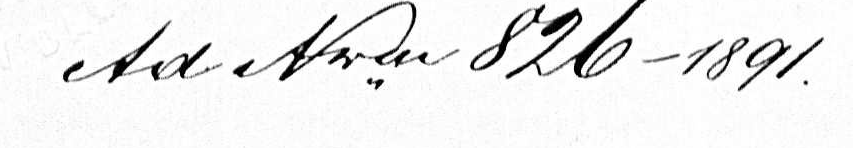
Ad Nr. 826 – 1891
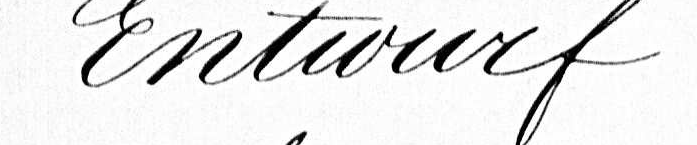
Entwurf
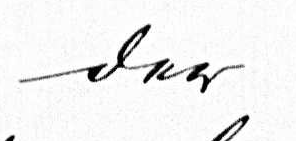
Der
